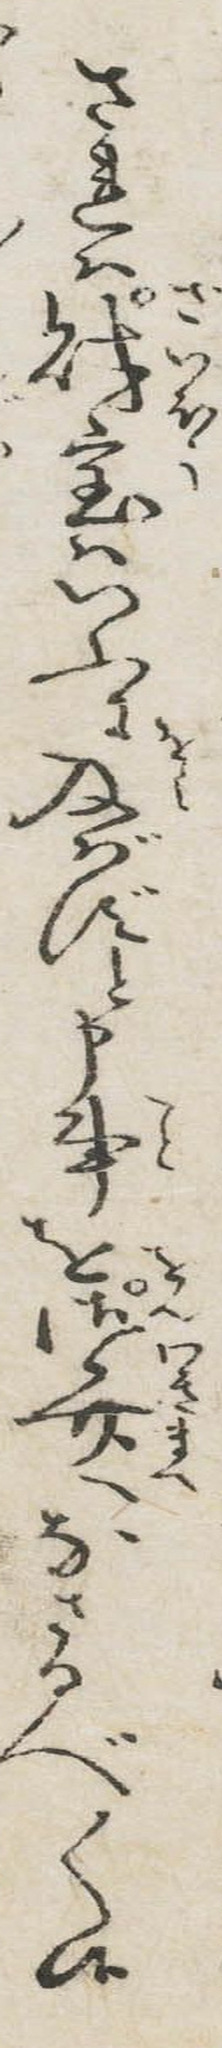されは。財宝はいふに及ばずと申事を。御弁へなさるべく候
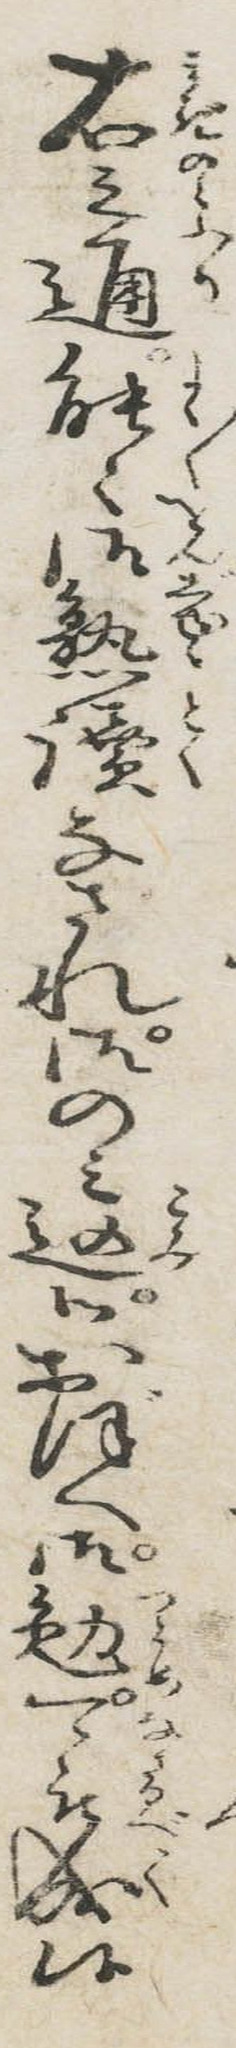右之通。能々御熟読なされ。御のみ込。御おぼへ。御勤。可被成候
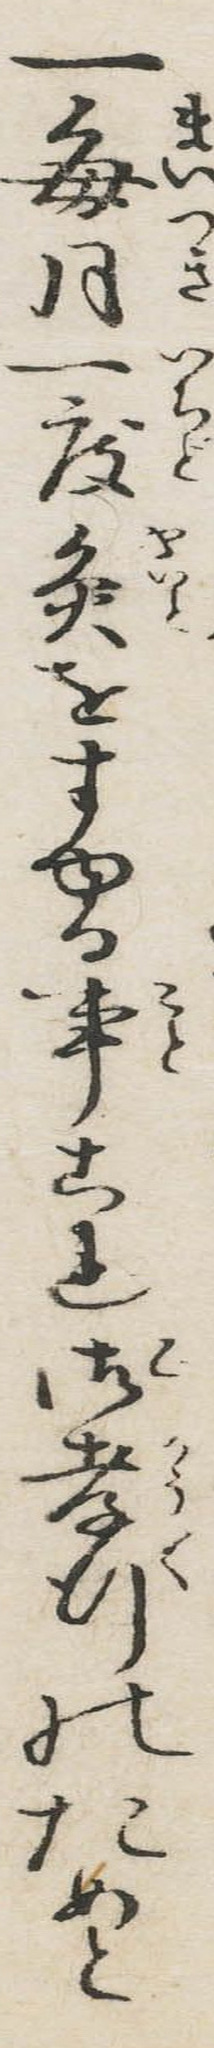一毎月一度灸をすゆる事これ御孝行のためと
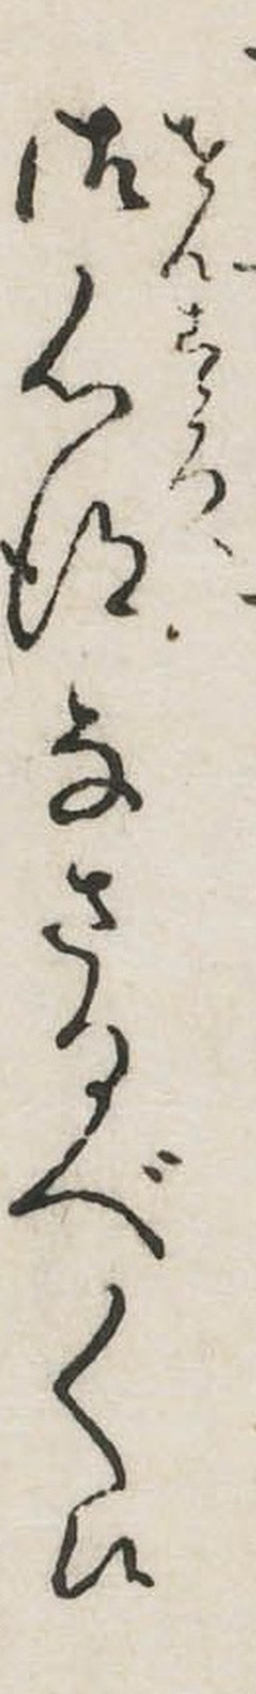御心得なさるべく候
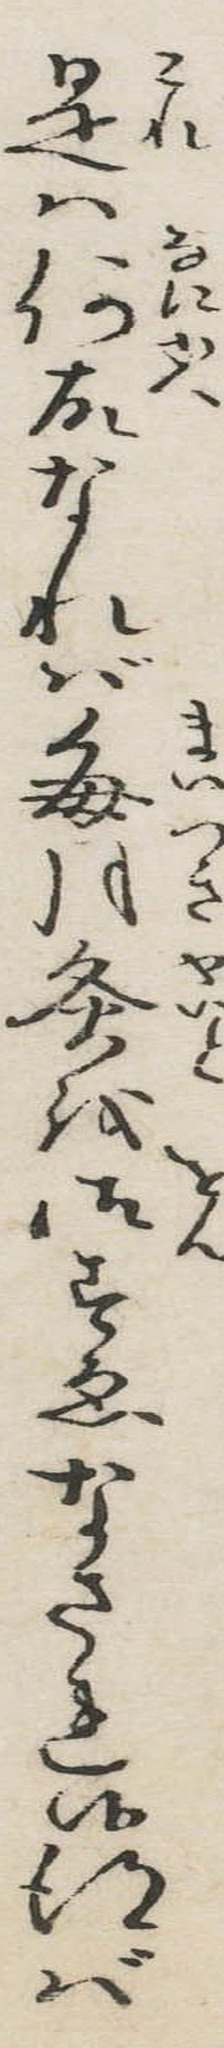是は何故なれば毎月灸を御すゑなされ候得ば
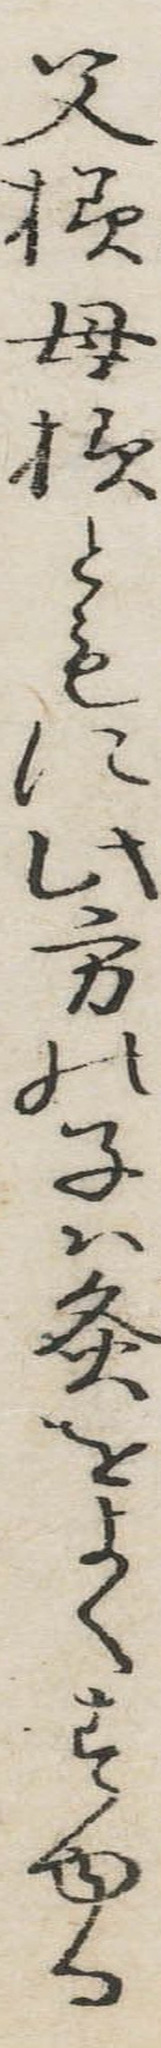父様母様ともに此方の子は灸をよくすゆる
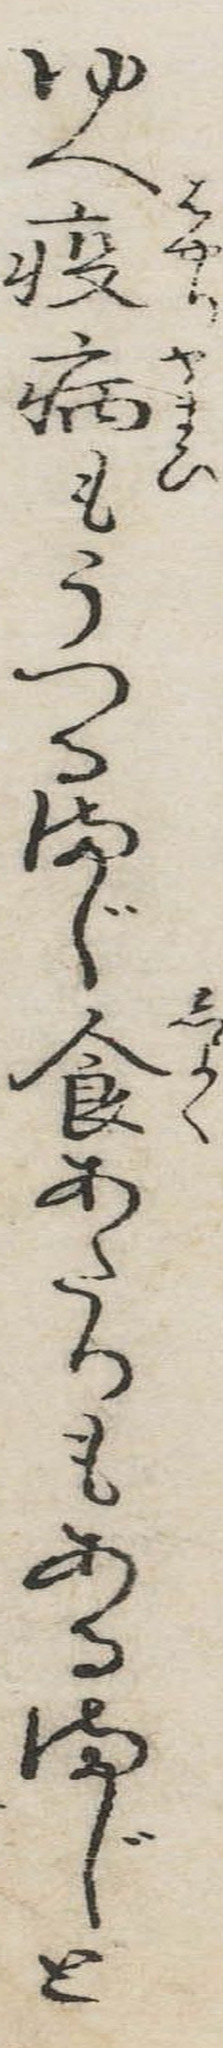ゆへ疫病もうつるまじ食あたりもあるまじと
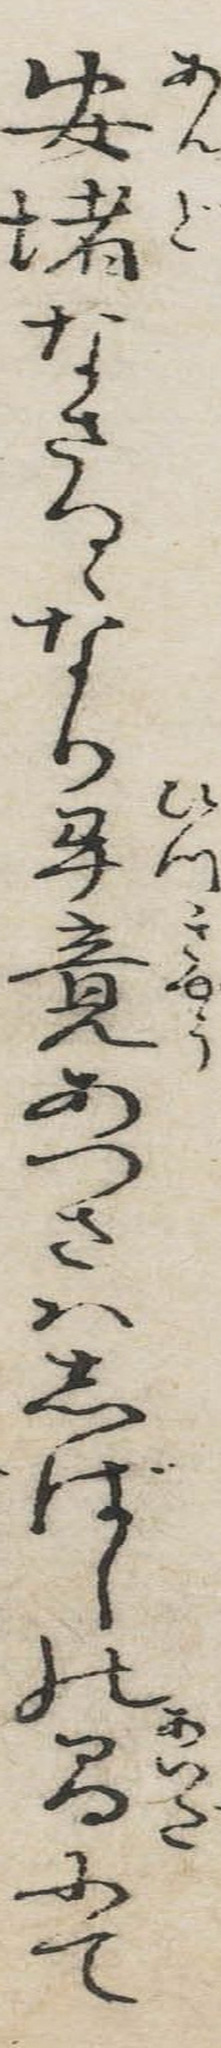安堵なさるゝなり畢竟あつさはしばしの間にて
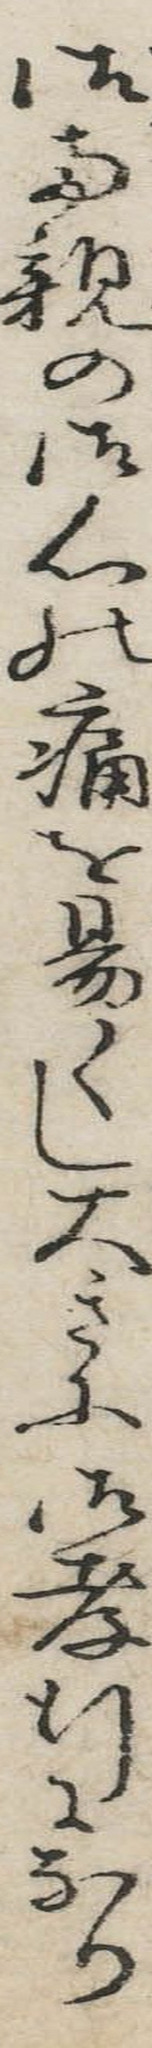御両親の御心の痛を易くし大きに御孝行になり
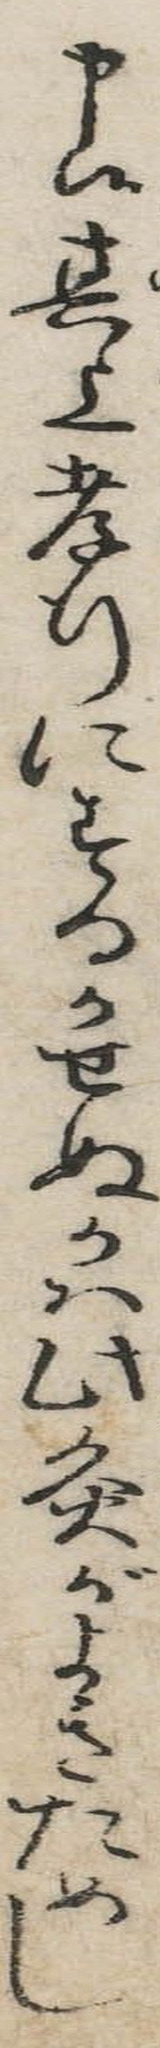申候其上孝行するかせぬかは此灸がよきためし
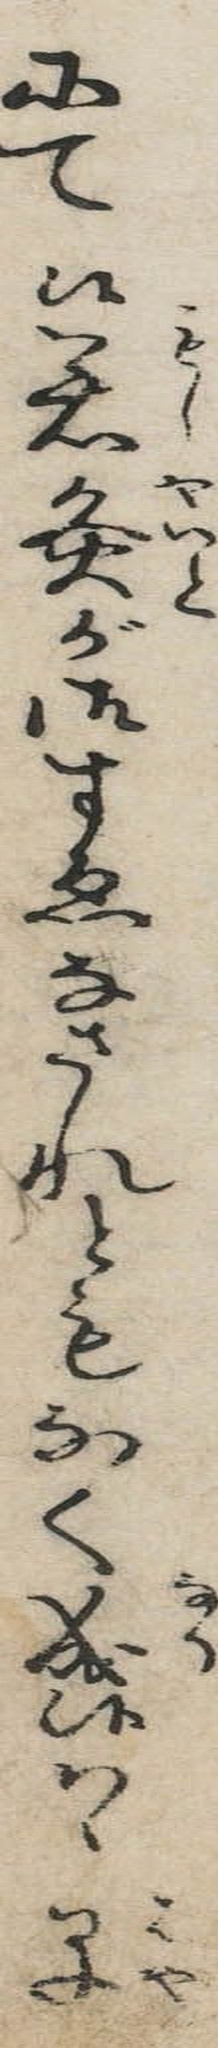にて候も若灸が御すゑなされともなく成候はゝ早

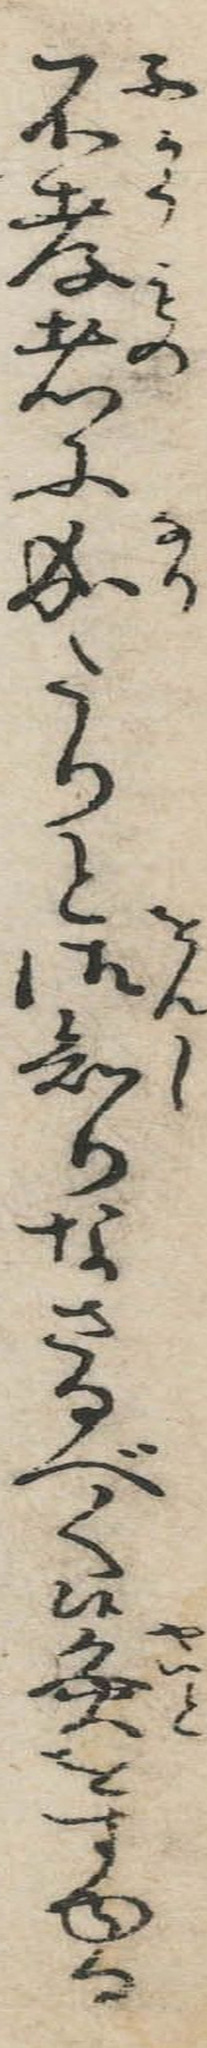不孝者に成たりと御知りなさるべく候灸をすゆる
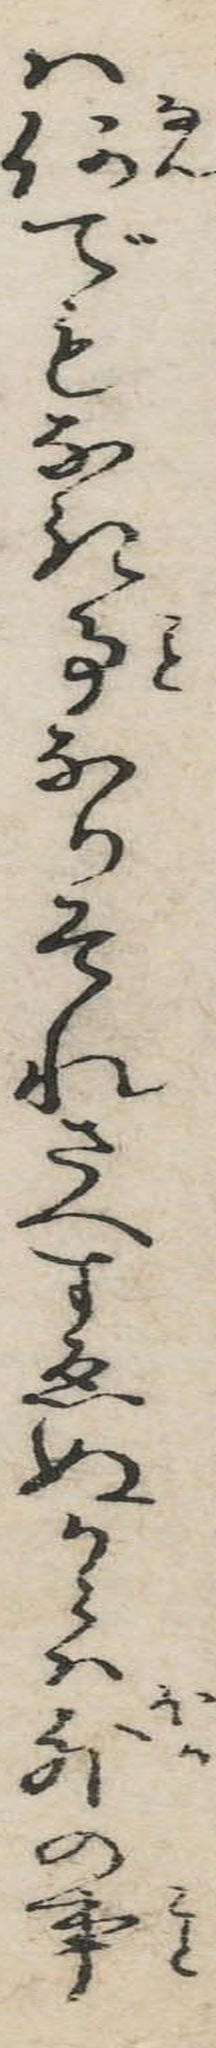は何でもなき事なりそれさへすゑぬからは外の事
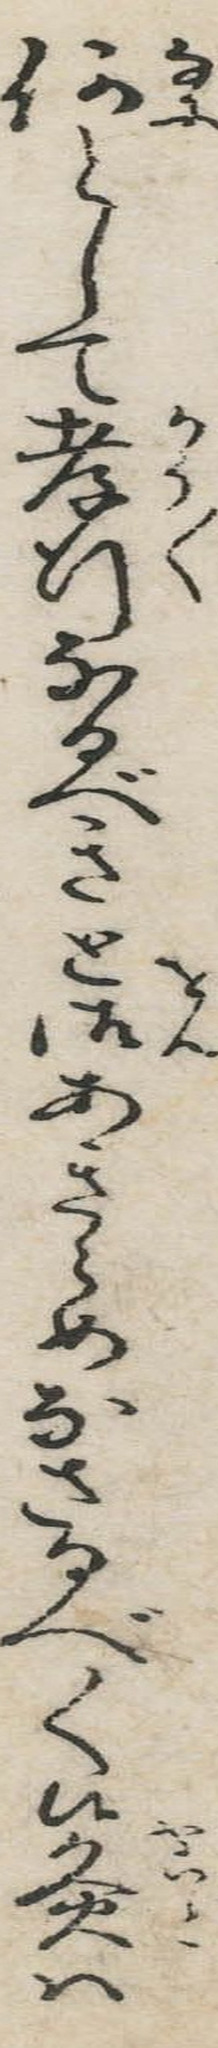何として孝行なるべきを御あきらめなさるべく候灸は
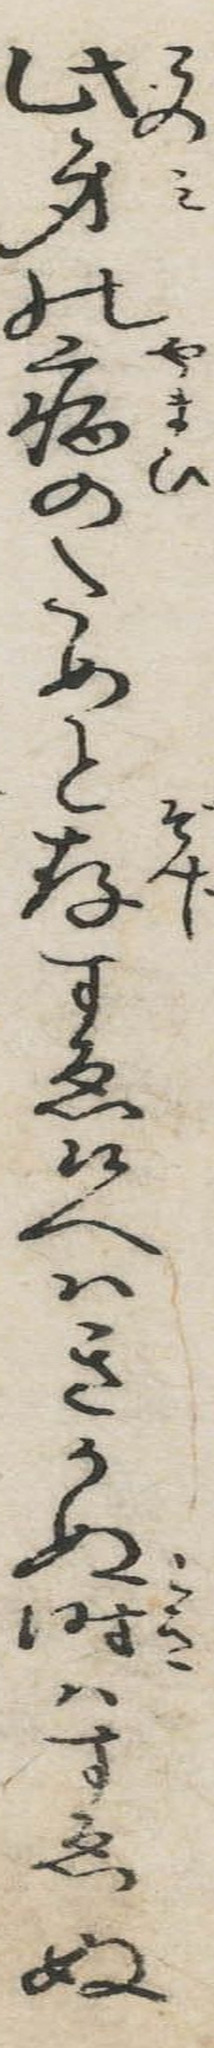此身の病のためと存すゑ候へはきかぬ時はすゑぬ
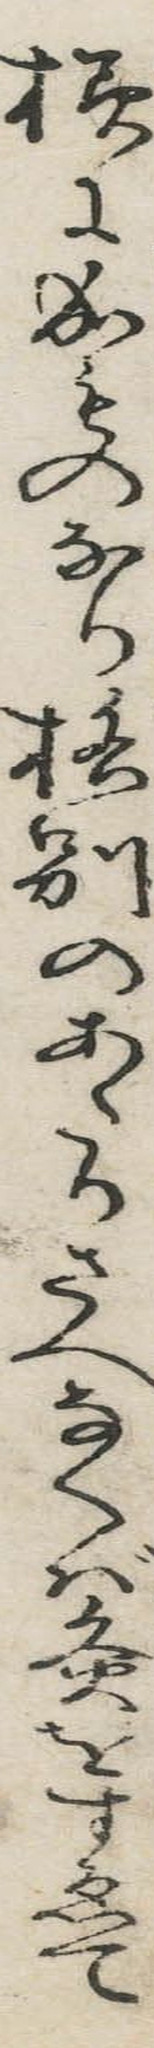様に成ものなり格別のあたりさへなくば灸をすゑて
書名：前訓
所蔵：東京学芸大学附属図書館
